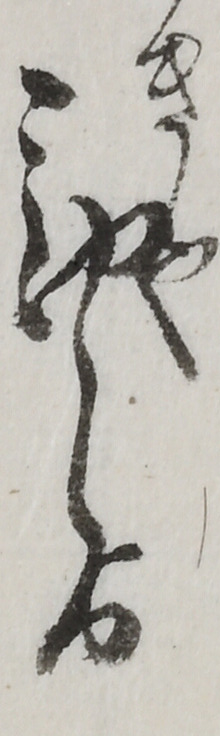作右衛門
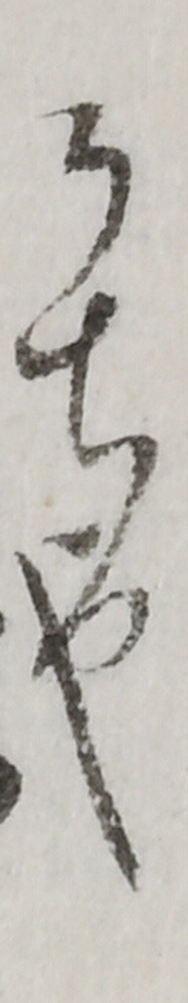うちや
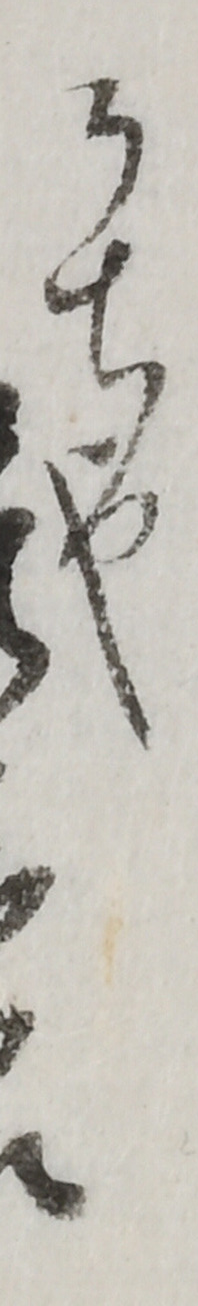うちや
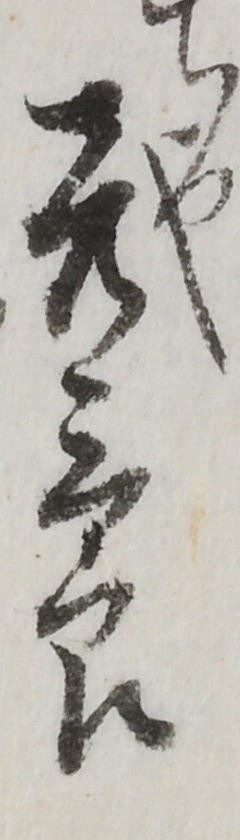喜三郎
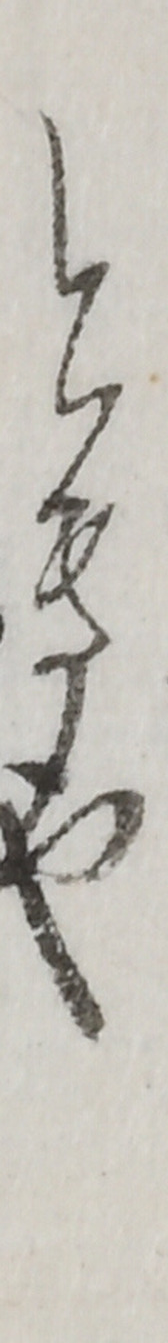ときや
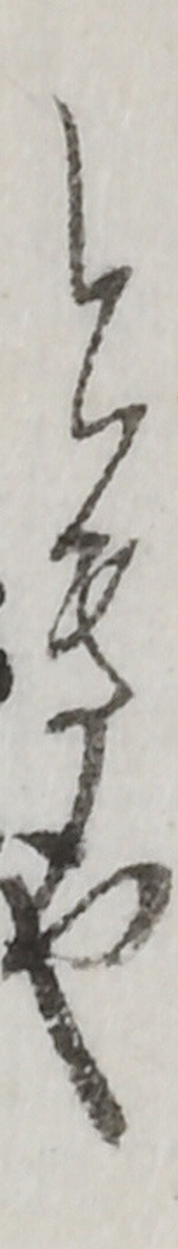ときや
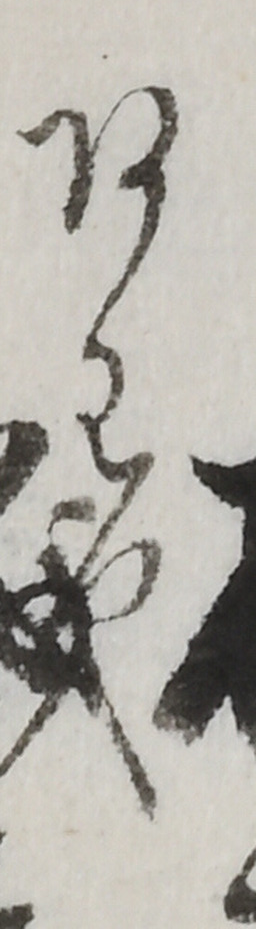あわや
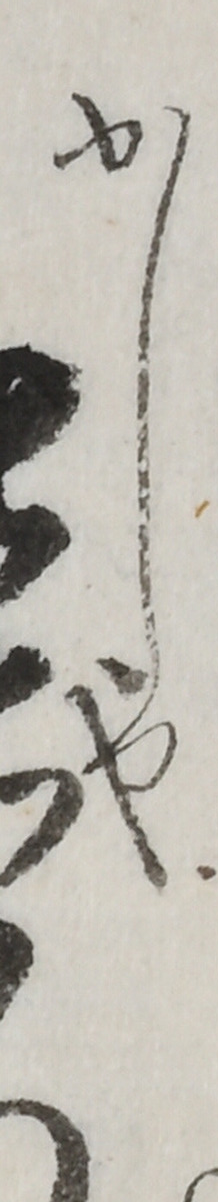かしや
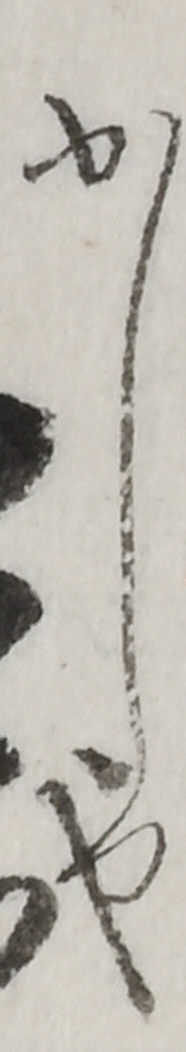かしや
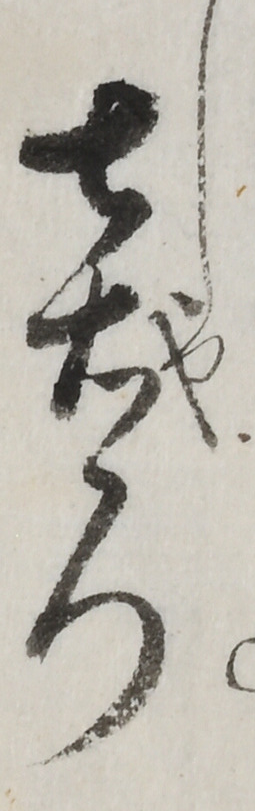七右衛門

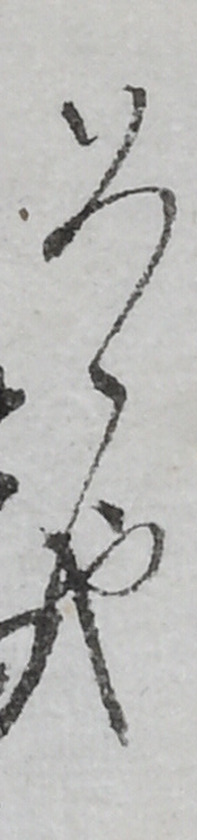いつゝや
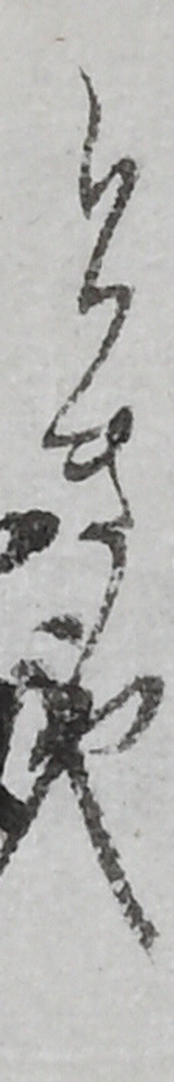ときや
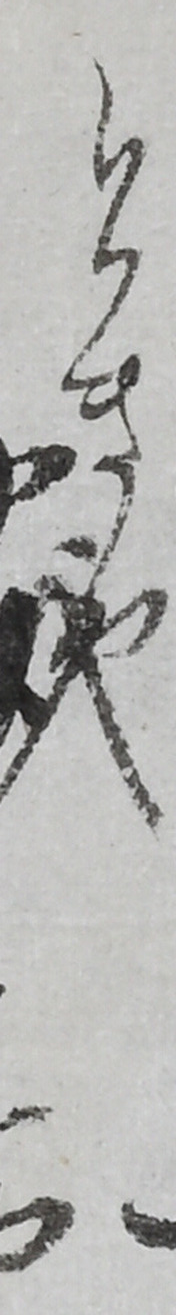ときや
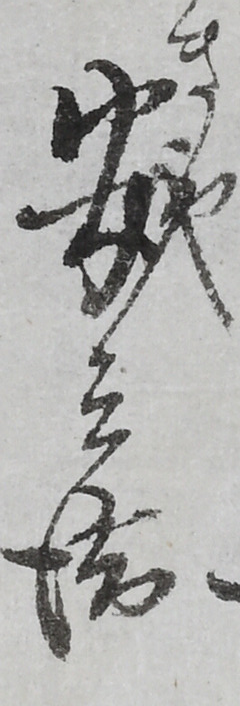甚兵衛
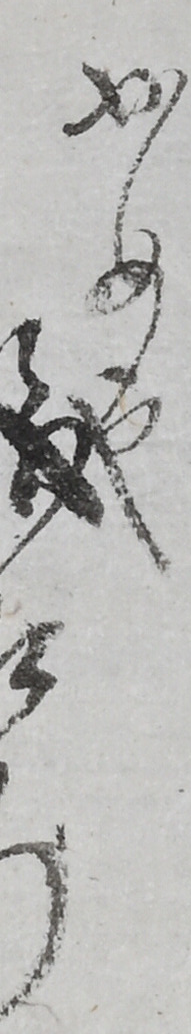かめや
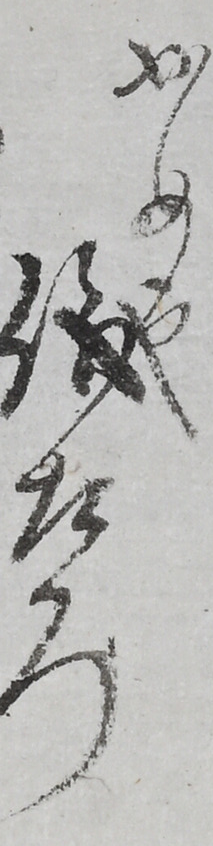儀左衛門
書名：當町火消道具幷役附帳
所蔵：伊那市立高遠町図書館・合同会社AMANE
